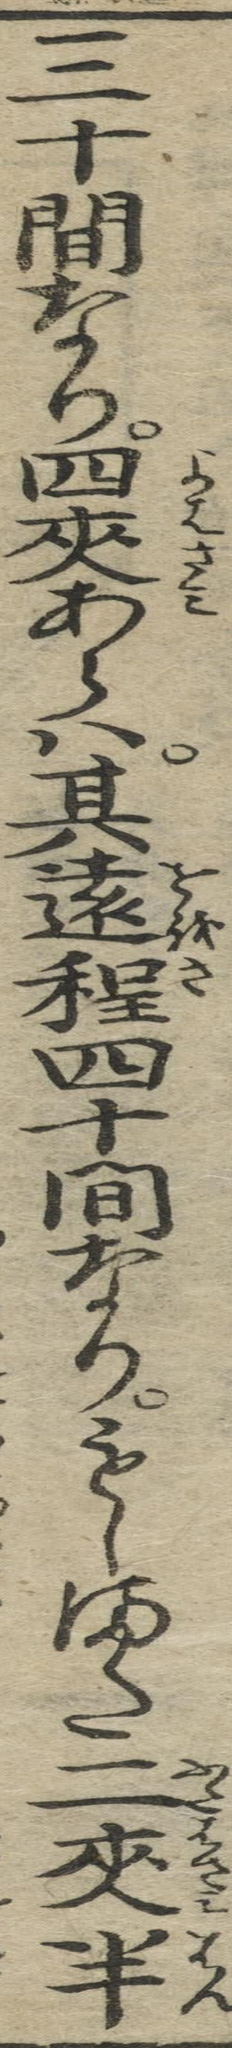三十間なり。四夾あらば。其遠程四十間なり。もしまた二夾半
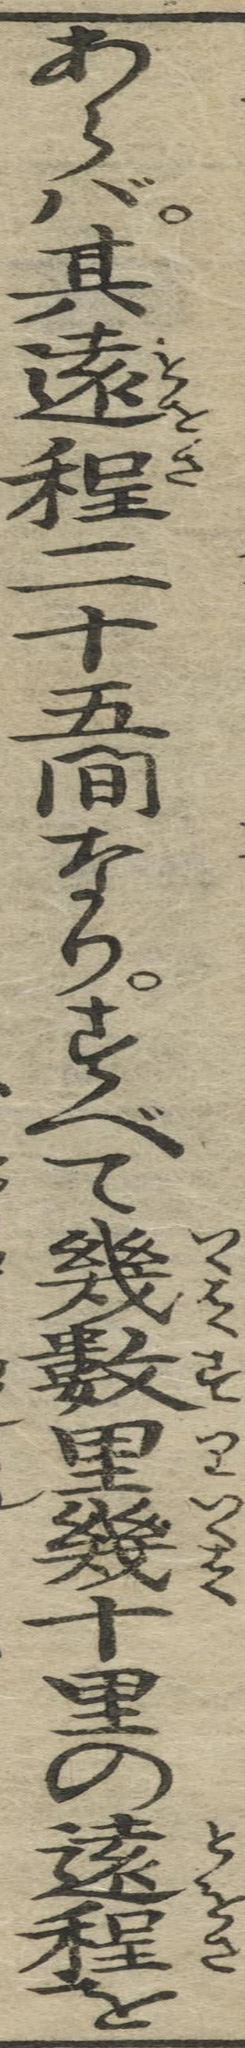あらば。其遠程ニ十五間なり。すべて幾数里幾十里の遠程を
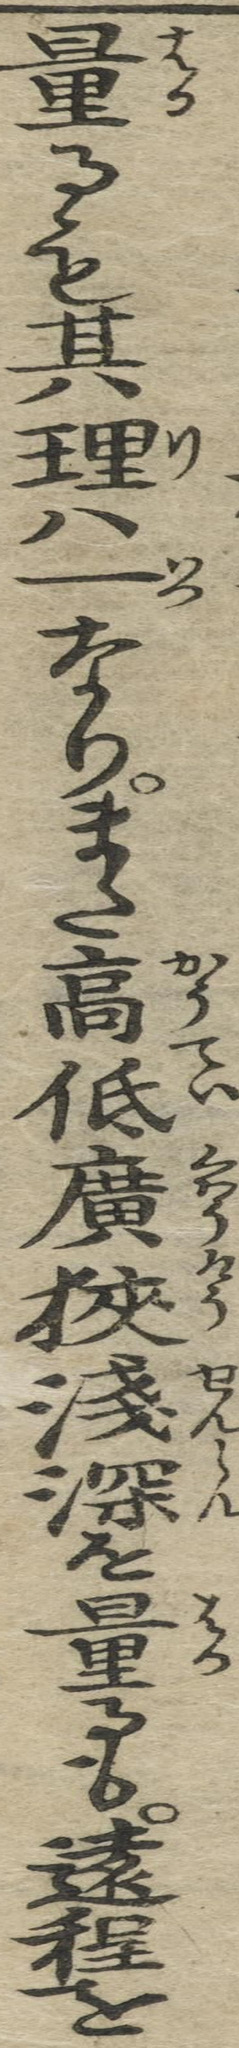量ること其理は一なり。また高低広狭浅深を量るも。遠程を
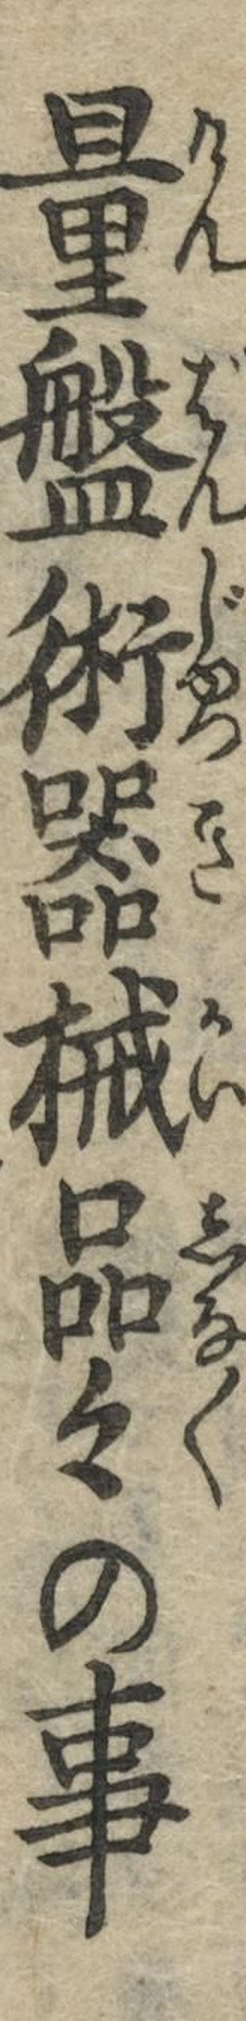量盤術器械品々の事
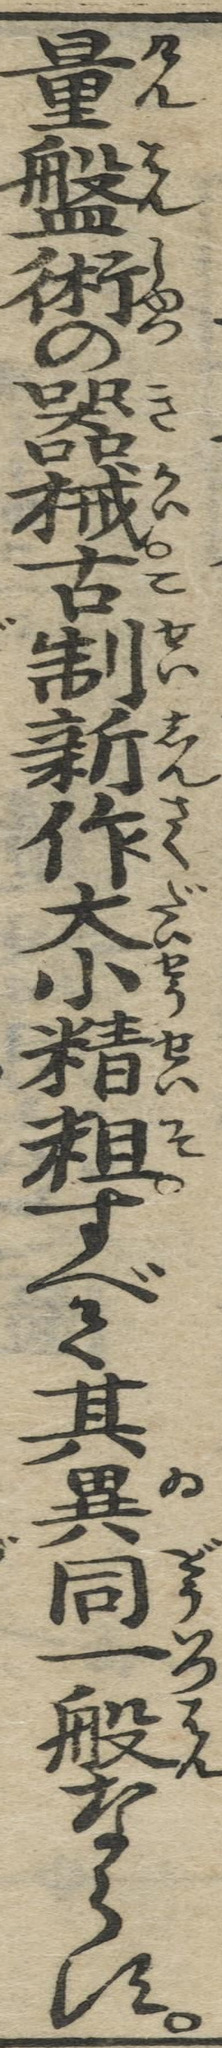量盤術の器械古制新作大小精粗。すべて其異同一般ならす。
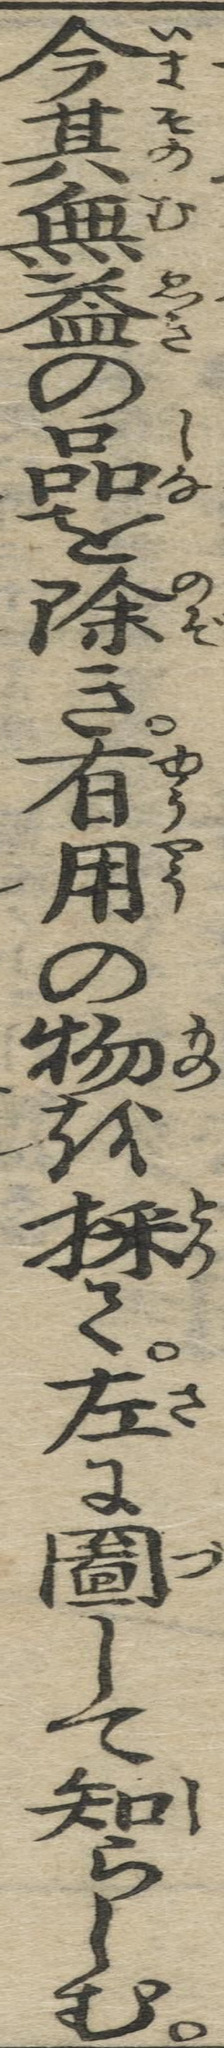今其無益の品を除き。有用の物を採て。左に図して知らしむ。
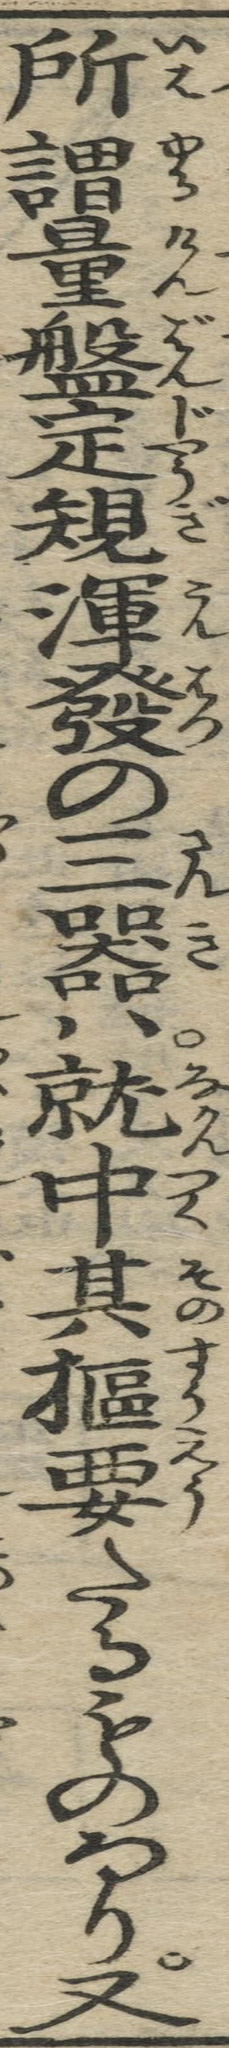所謂量盤定規渾発の三器は。就中其枢要たるものなり。又
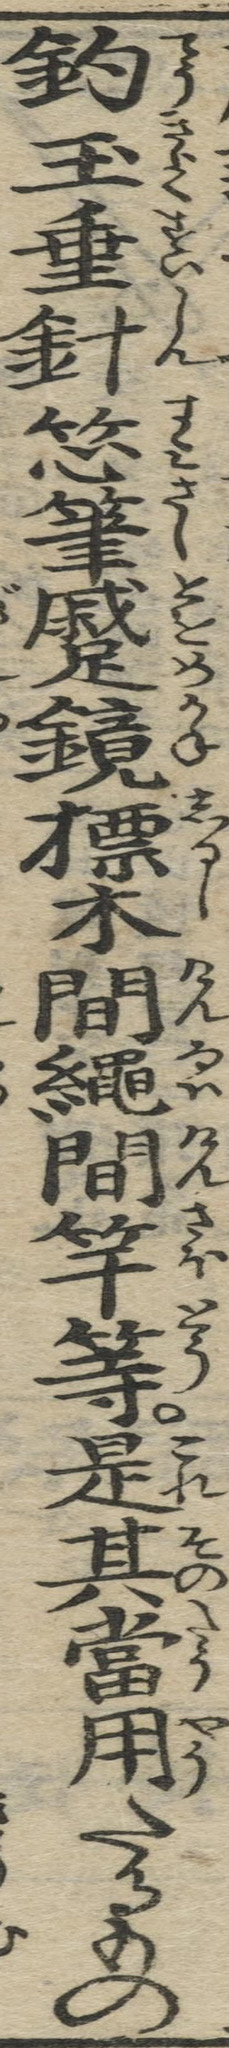釣玉垂針芯筆蹙鏡標木間縄間竿等。是其当用たるもの
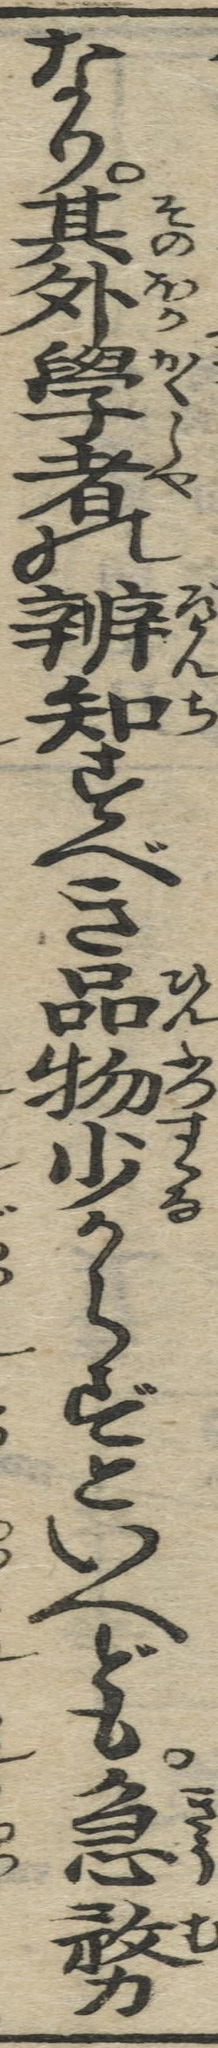なり。其外学者の辯知すべき品物少からずといへども。急務
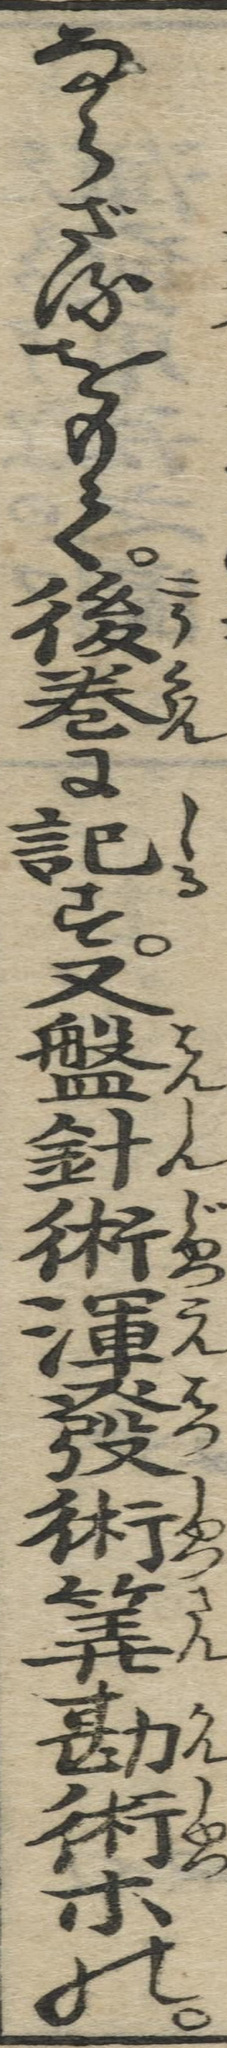ならざるをもて。後巻に記す。又盤針術渾発術算勘術等の。
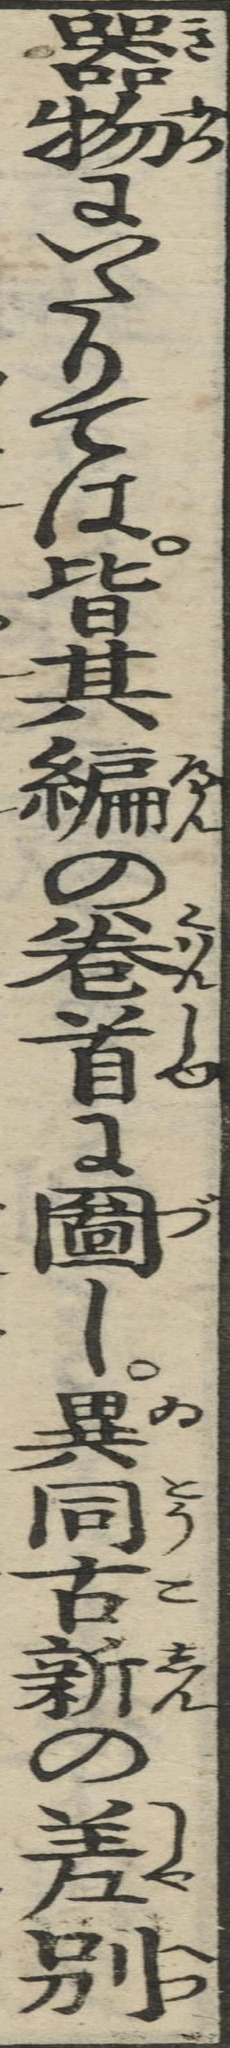器物にいたりては。皆其編の巻首に図し。異同古新の差別
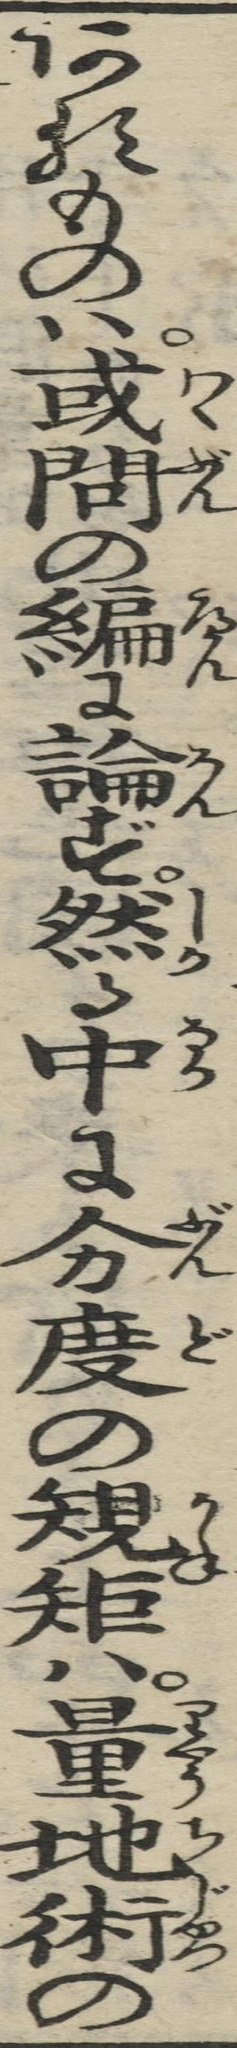あるものは。或問の編に論ず。然る中に分度の規矩は。量地術の
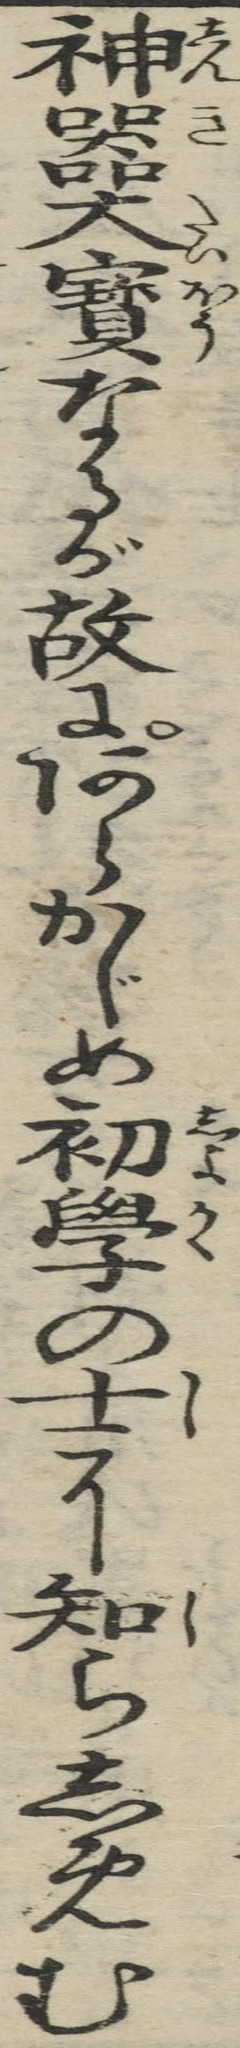神器大宝なるが故に。あらかじめ初学の士に知らしめむ
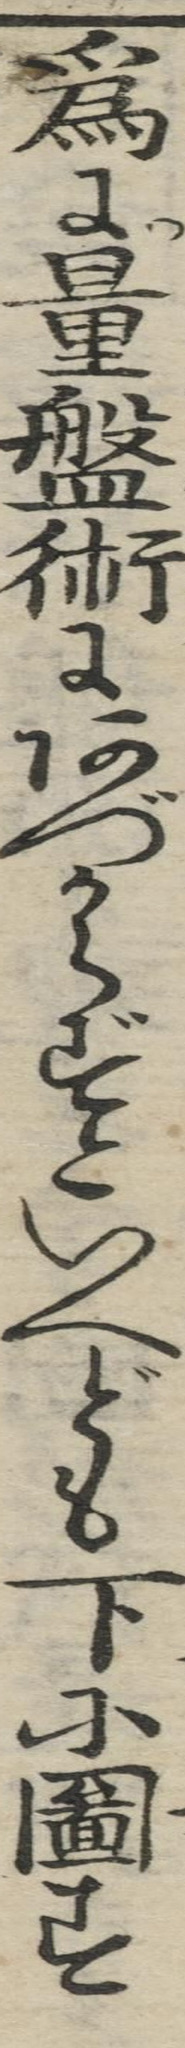為に。量盤術にあづからずといへども下に図す
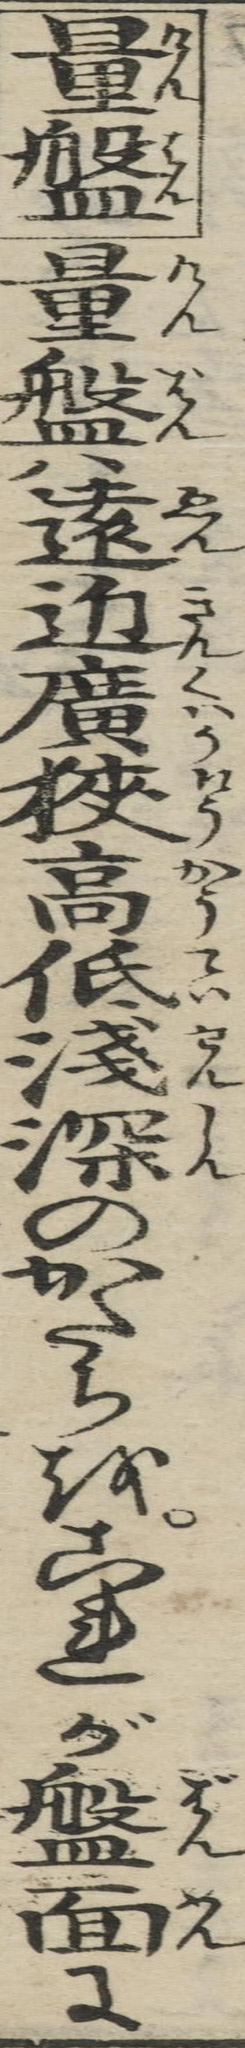量盤量盤は遠近広狭高低浅深のかたちを。これが盤面に
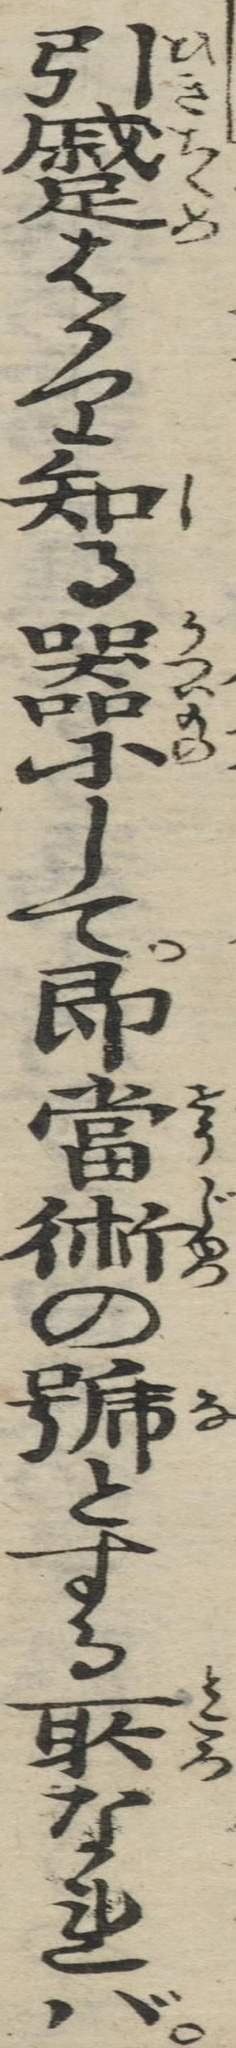引蹙はかり知る器にして。即当術の号とする所なれば。
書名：量地指南　巻之一（内題）
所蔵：東京大学地震研究所図書室 Earthquake Research Institute Library, The University of Tokyo, JAPAN
